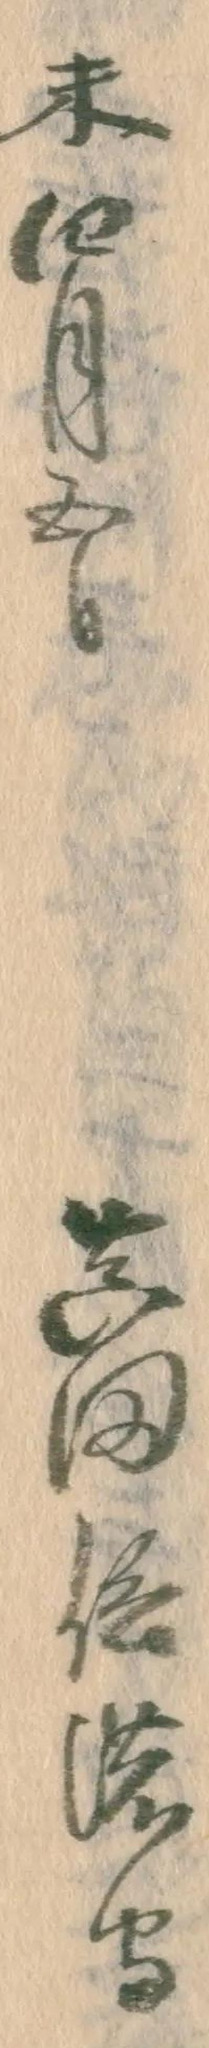未四月五日真田信濃守
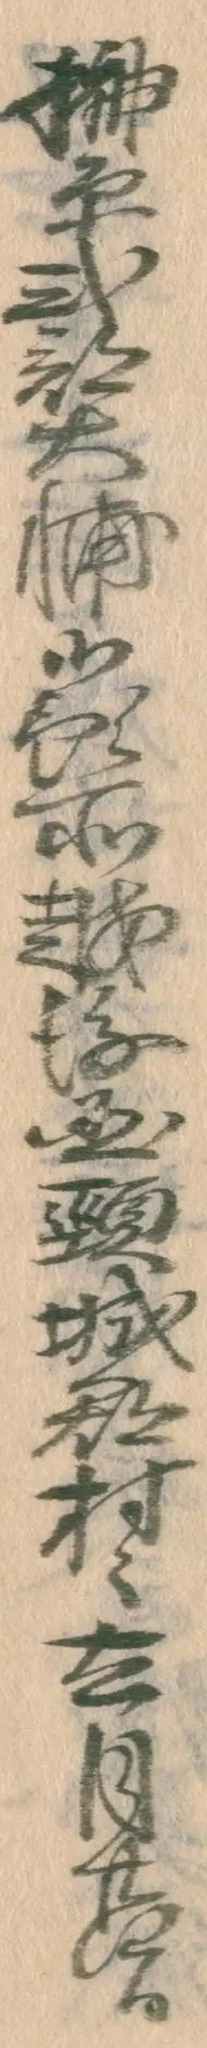榊原式部大輔御預所越後国頚城郡村々去月廿四日
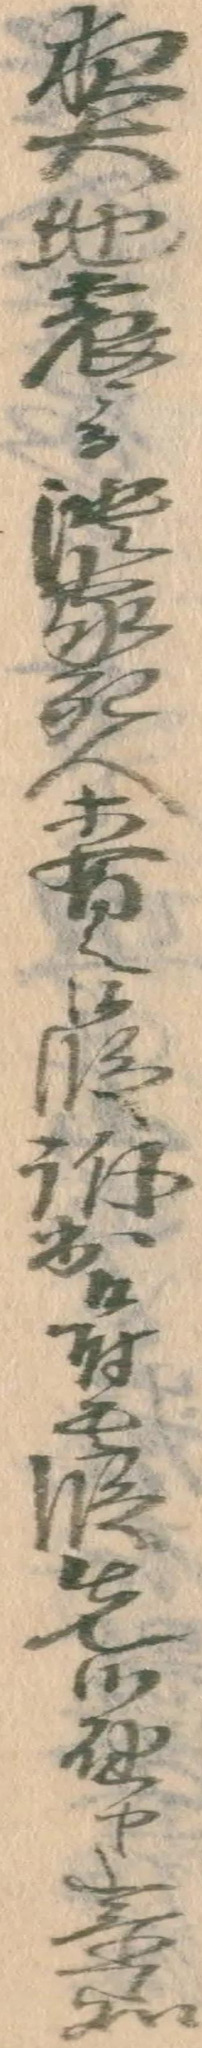夜大地震ニ而潰家死人等有之候段訴出候付其段先御届申上置候処
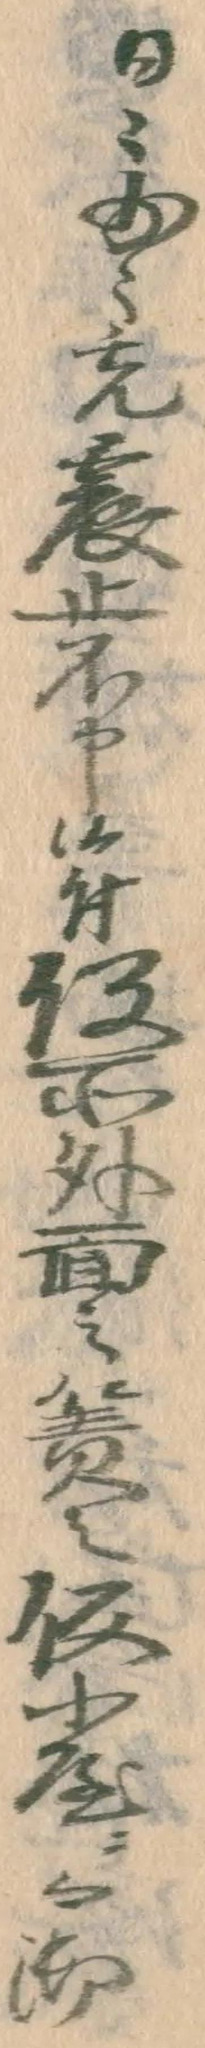日々少々宛震止不申候付役所外面々簀之仮小屋ニ而御
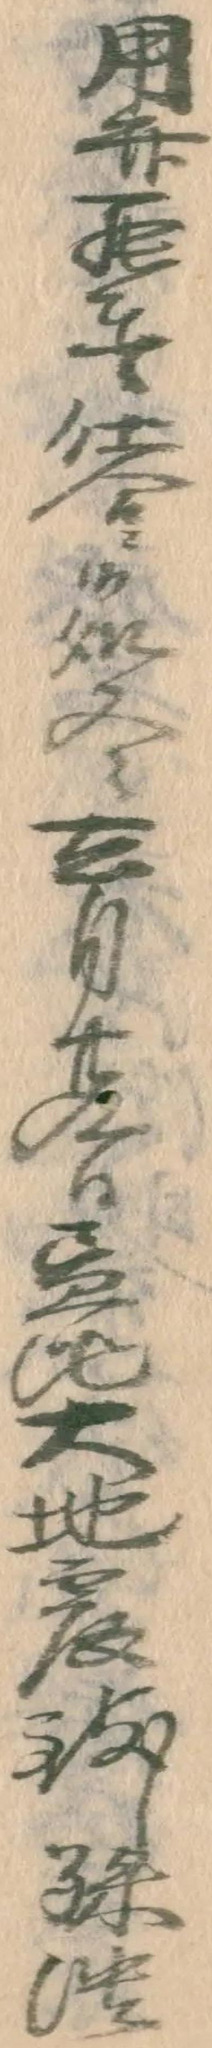用弁罷在候仕合二候処又々去月廿九日昼比大地震致し殊潰
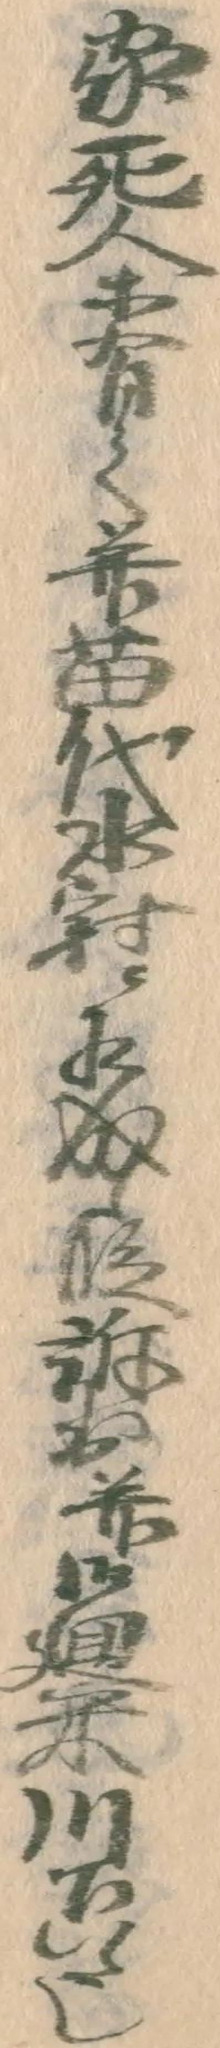家死人等有之并苗代田水冠ニ相成候段訴出并御廻米川下いたし
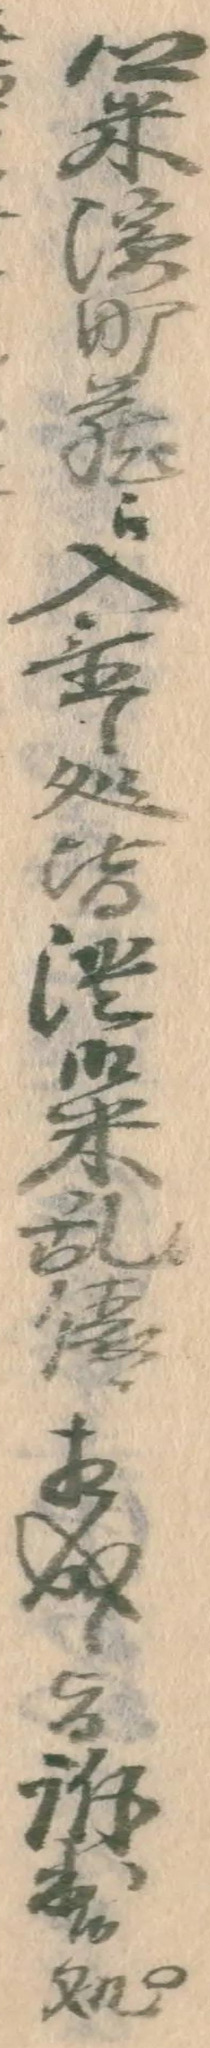郷米浜町蔵江入置候処皆潰御米乱俵ニ相成候旨訴出候処
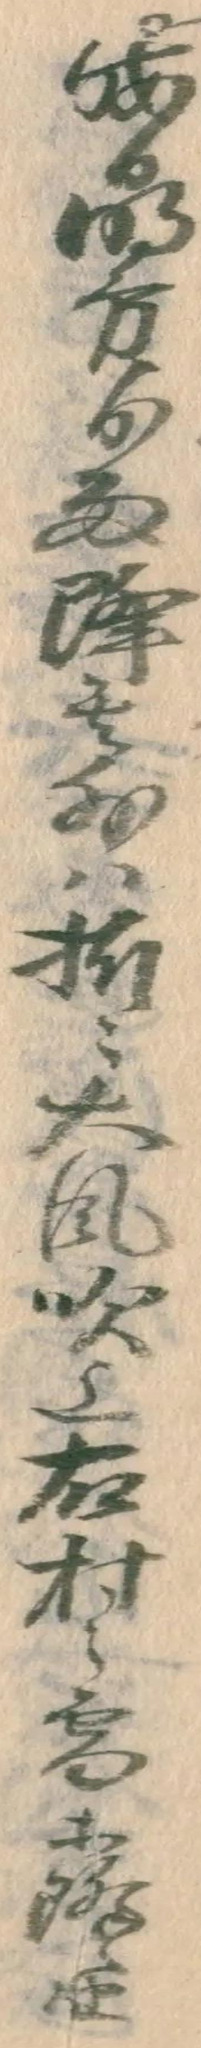晦日明方ゟ雨降其外ハ折々大風吹上右村々雪相降候由
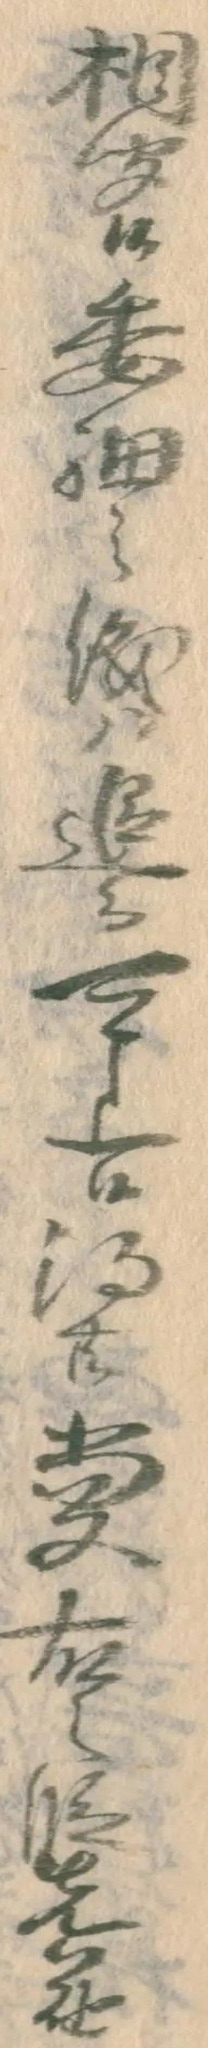ニ相聞候委細之儀ハ追而可申上候得共尚又右之段先御届
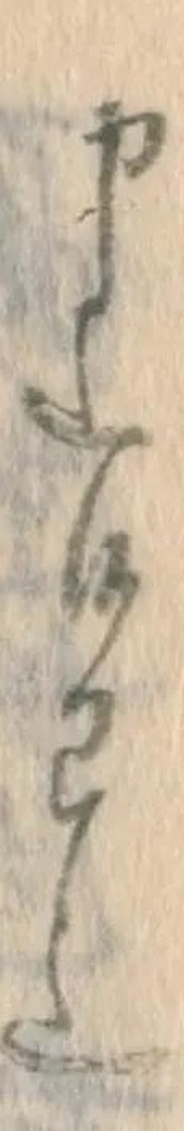申上候已上
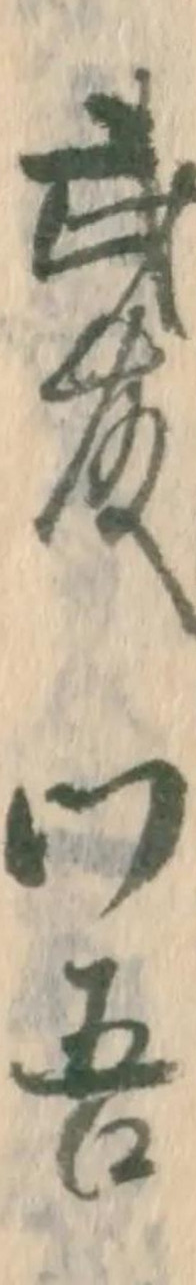武藤門吾
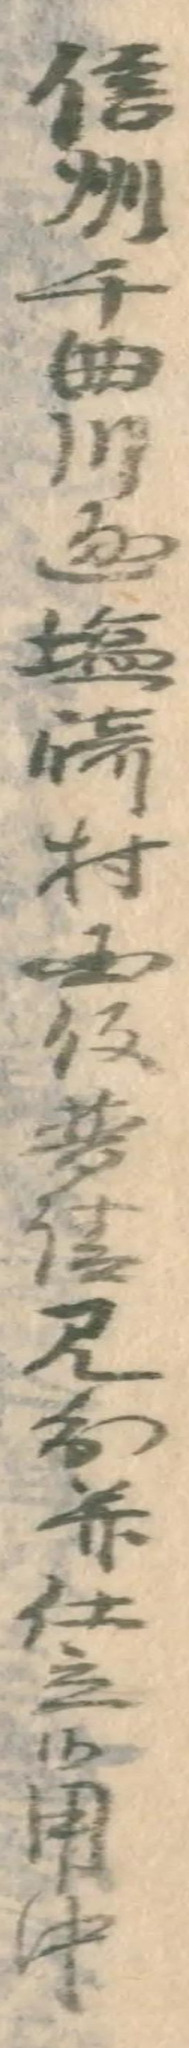信州千曲川通塩崎村国役御普請見分并仕立御用中
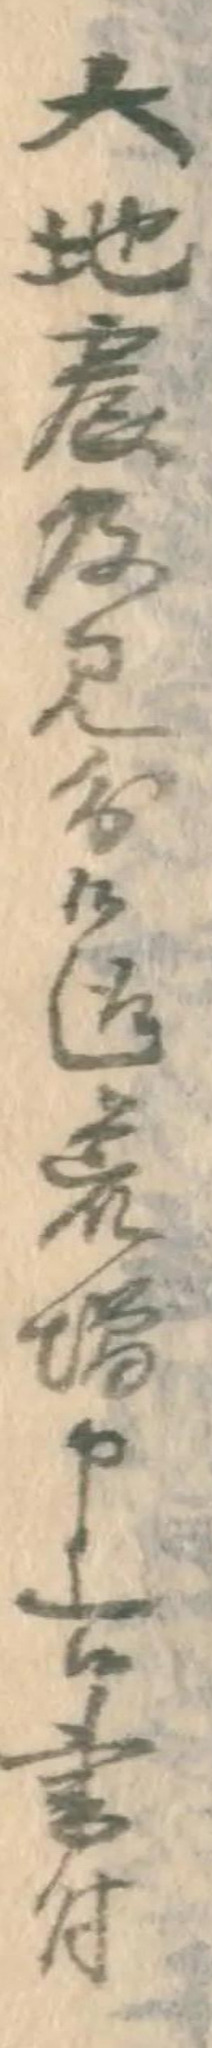大地震及見分候趣荒増申上候書付

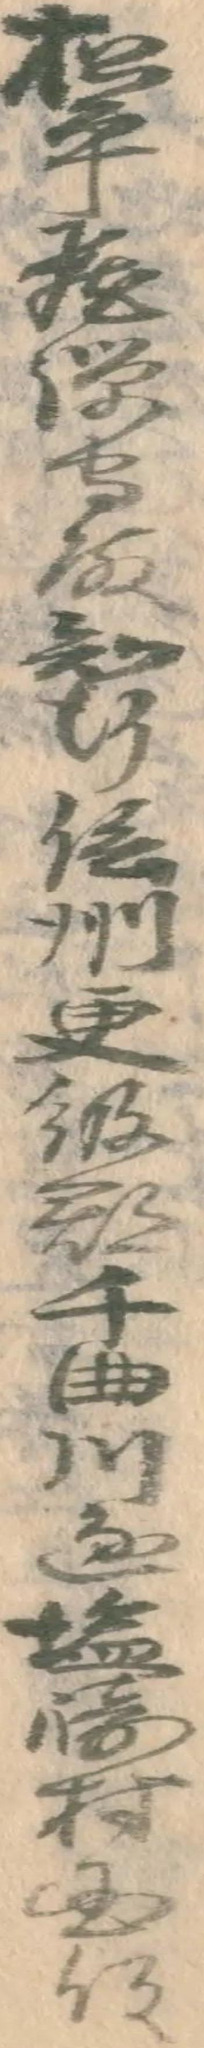松平飛騨守殿知行信州更級郡千曲川通塩崎村国役
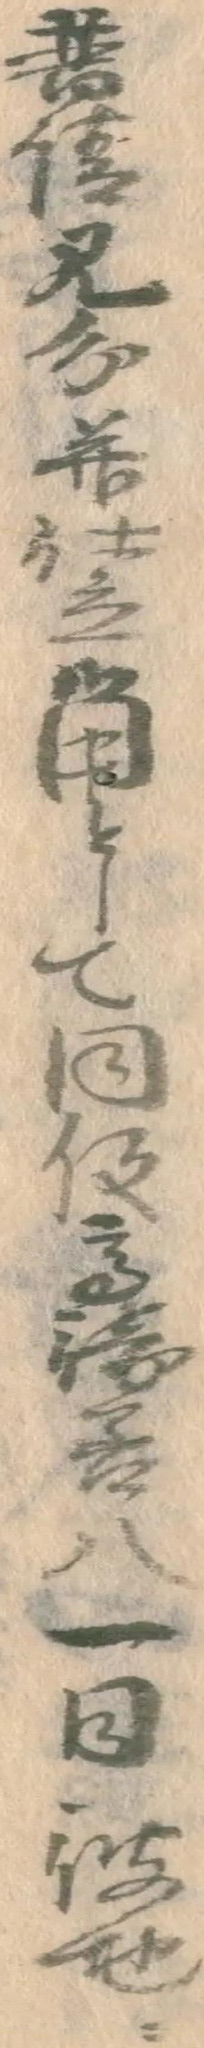普請見分并仕立御用として同役高崎善八一同彼地ニ
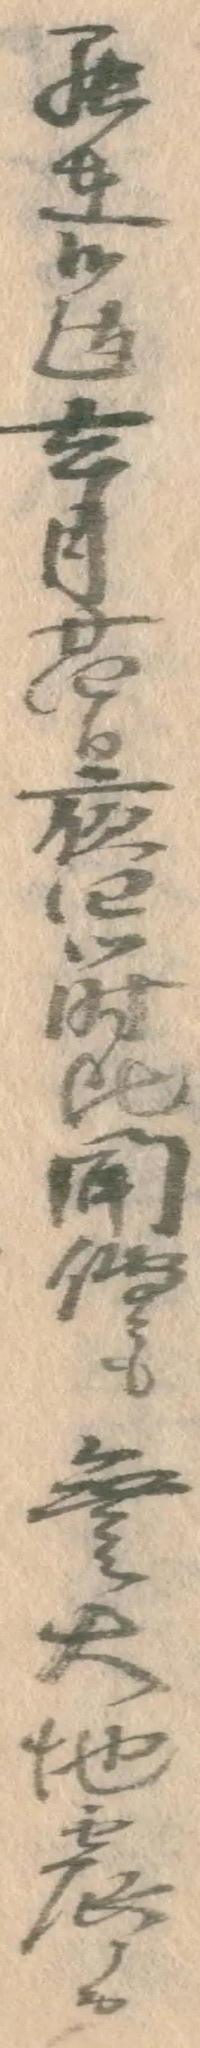罷在候趣去月廿四日夜四時比聞伝ニも無之大地震ニ而
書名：信州大地震之記
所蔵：国立国会図書館 National Diet Library, JAPAN
